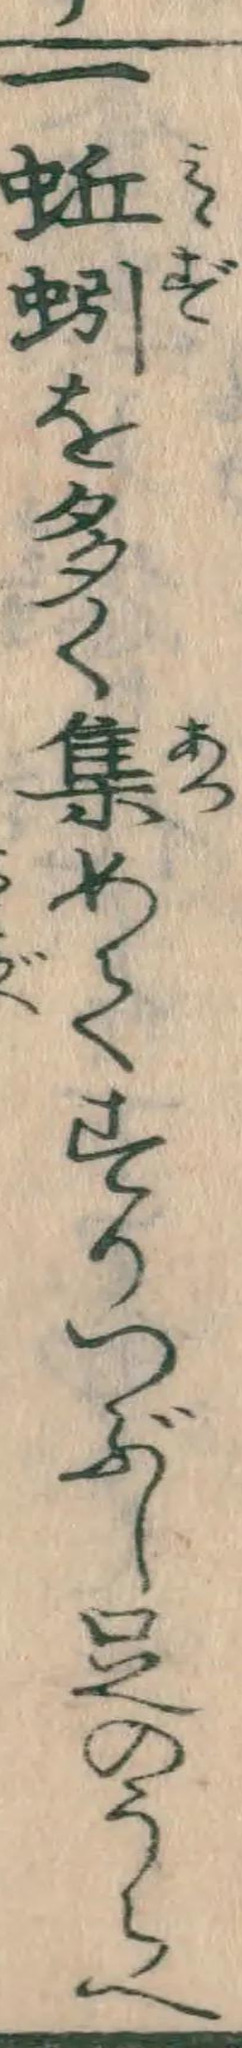一蚯蚓を多く集めてすりつぶし足のうらへ
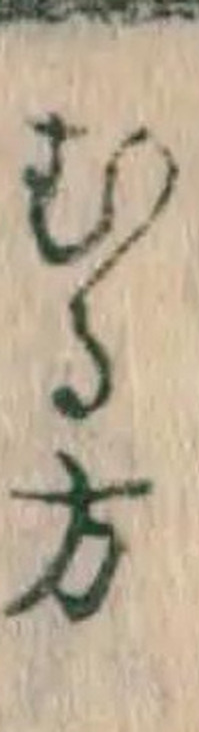むる方
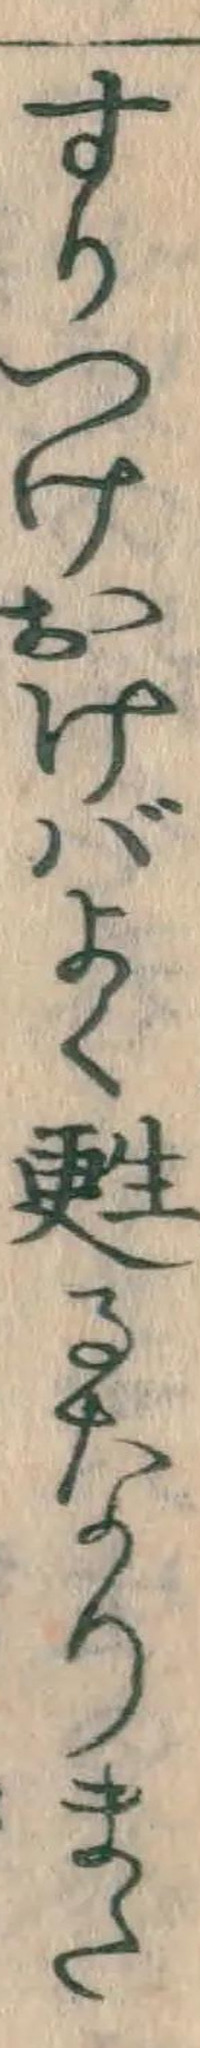すりつけおけばよく甦るなりまた
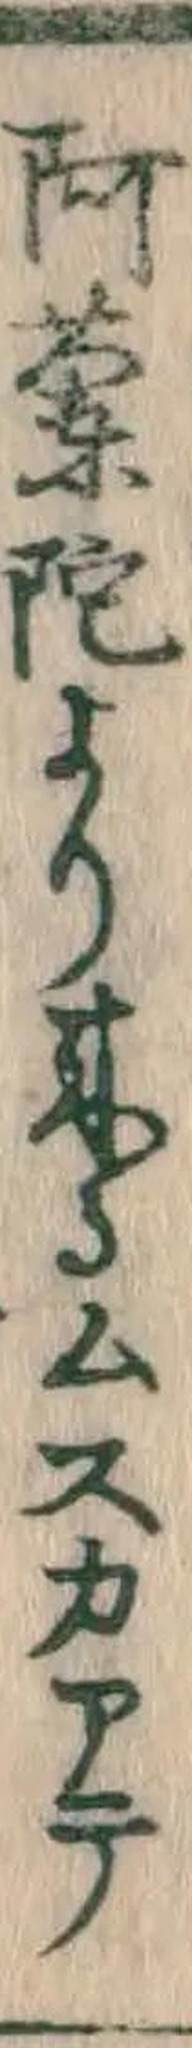阿蘭陀より来るムスカアテ
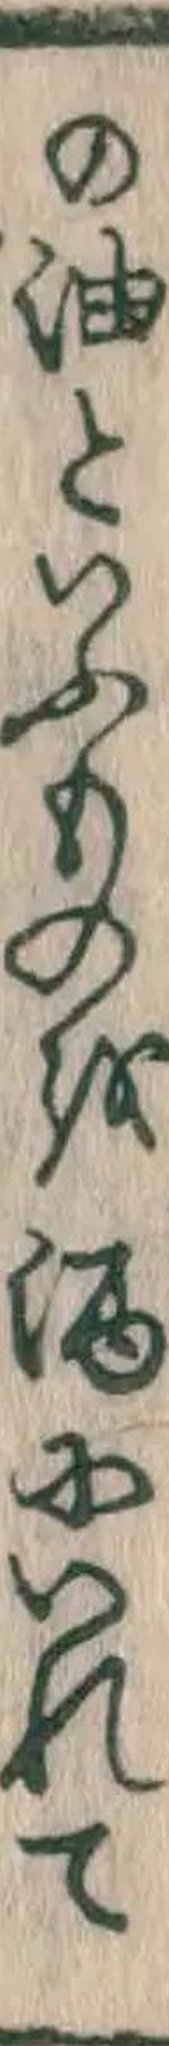の油といふものを酒にいれて
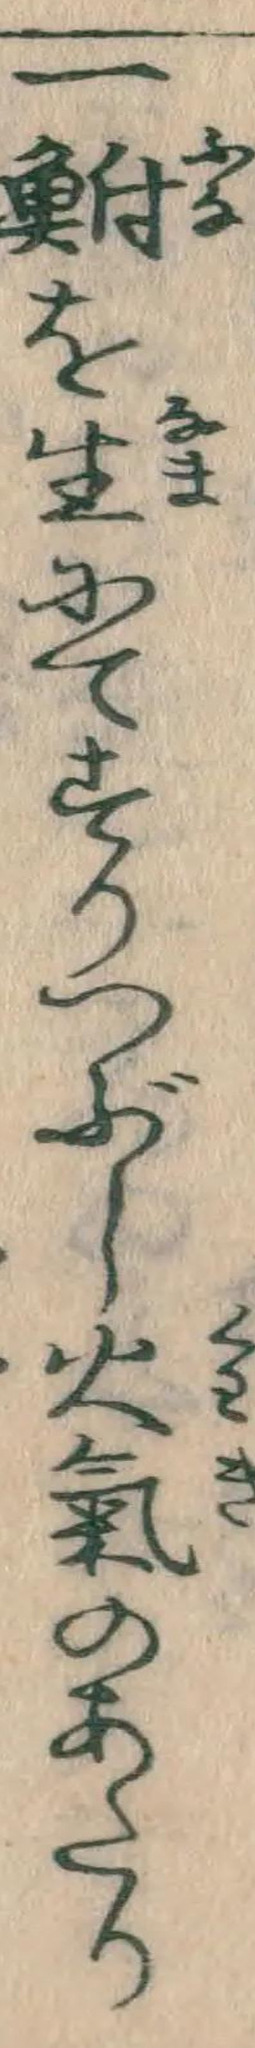一鮒を生にてすりつぶし火気のあたり
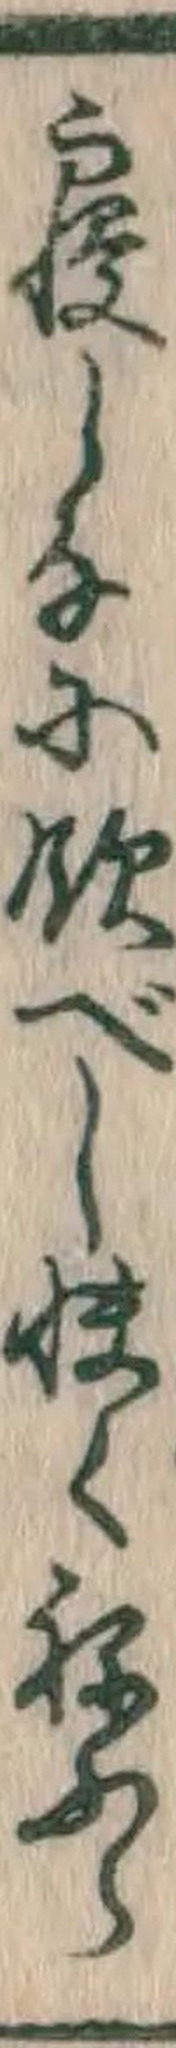寝しなに飲べし快くねふら
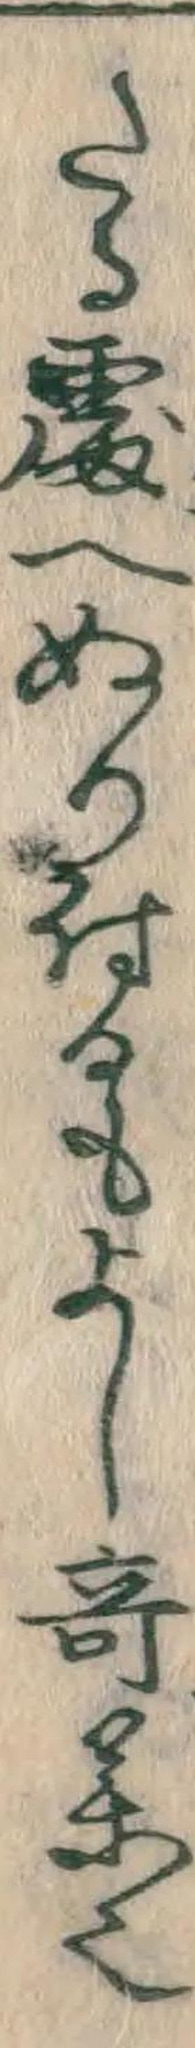たる処へぬり付るもよし奇薬也
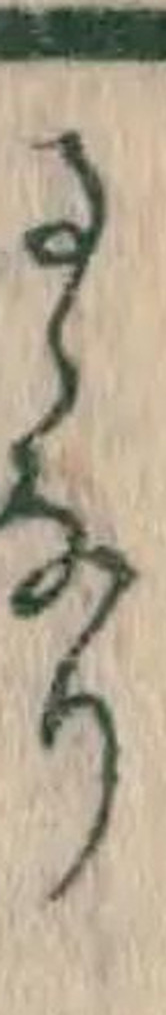るゝなり
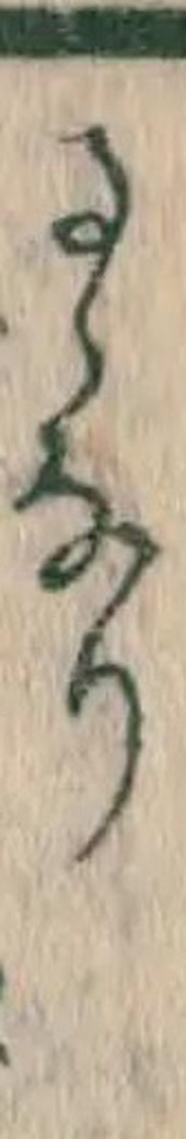るゝなり
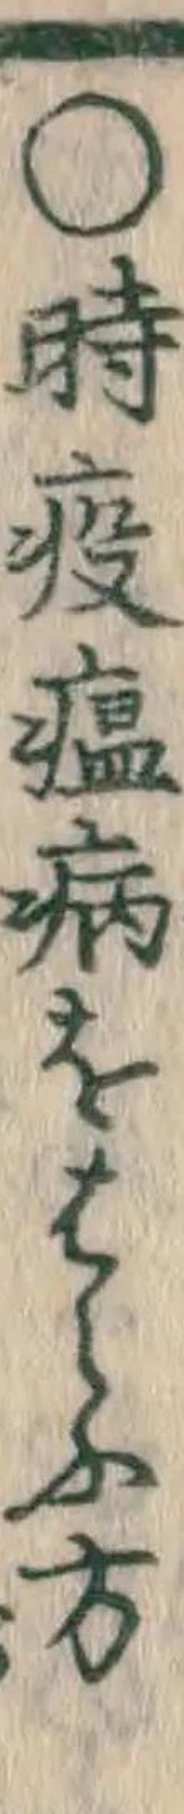○時疫瘟病をはらふ方
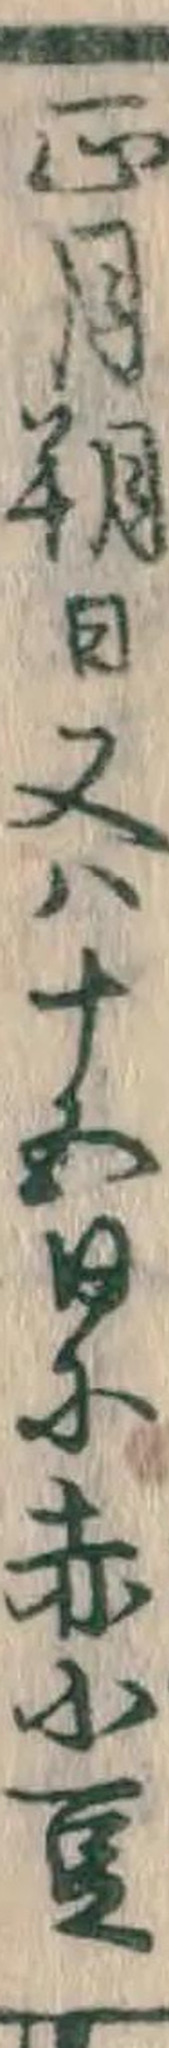正月朔日又は十五日に赤小豆
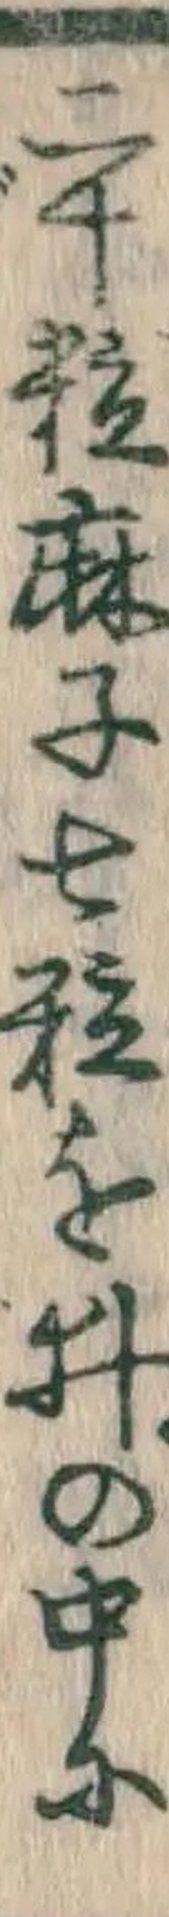二十粒麻子七粒を井の中に
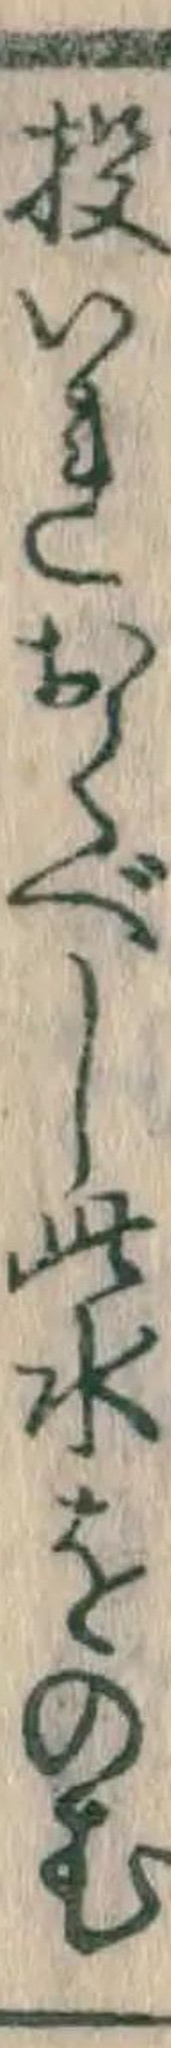投いれおくべし此水をのむ
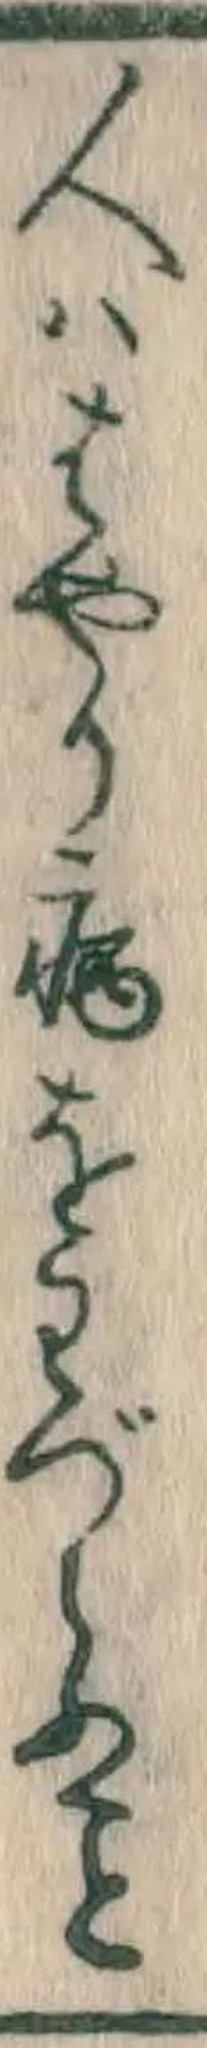人ははやり病をわづらふこと
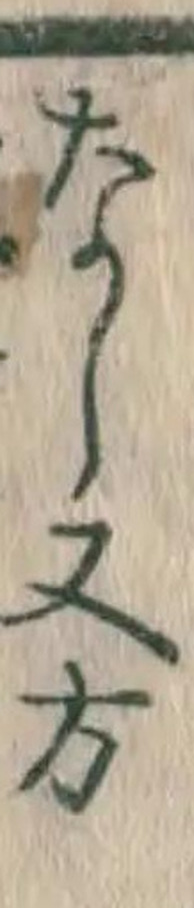なし又方
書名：広益秘事大全 3巻. [4]
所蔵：国立国会図書館 National Diet Library, JAPAN
